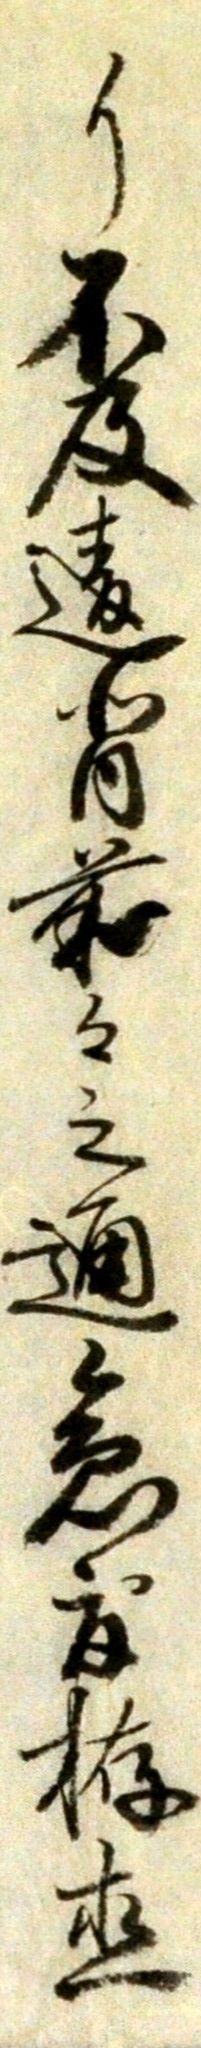り不及違背前々之通急度拵直
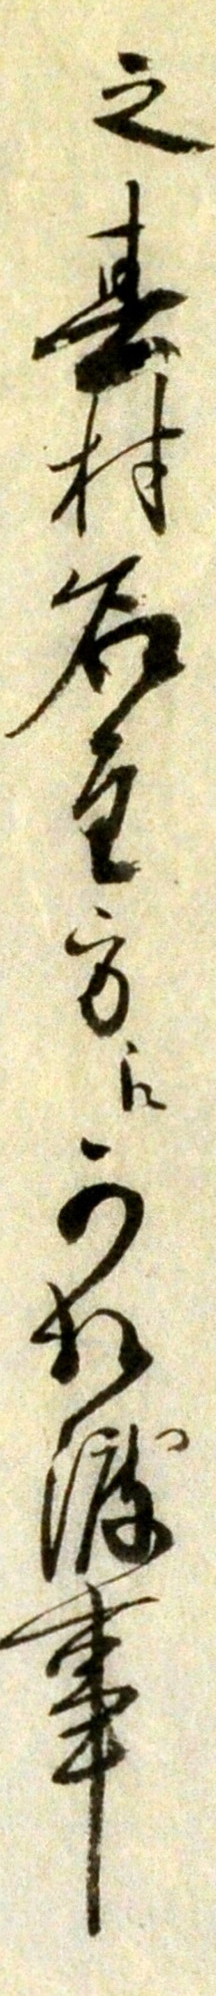之其村名主方江可相渡事
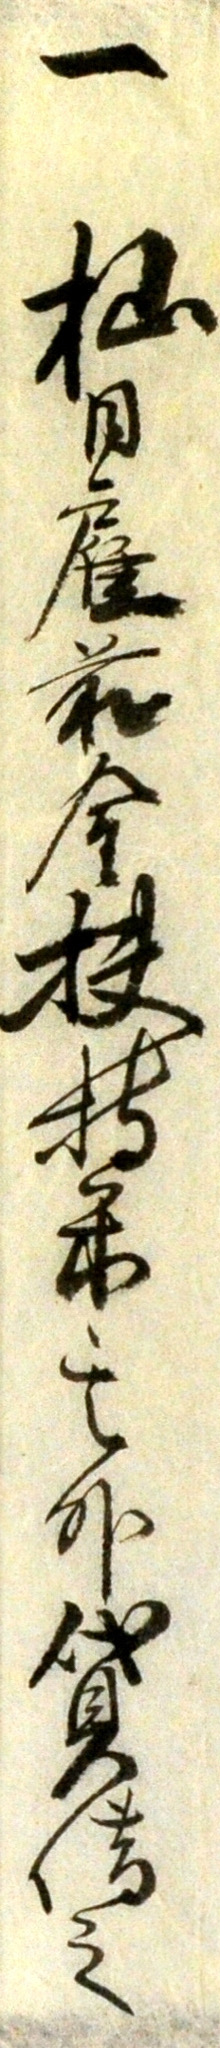一杣日雇前金扶持米其外貸借之
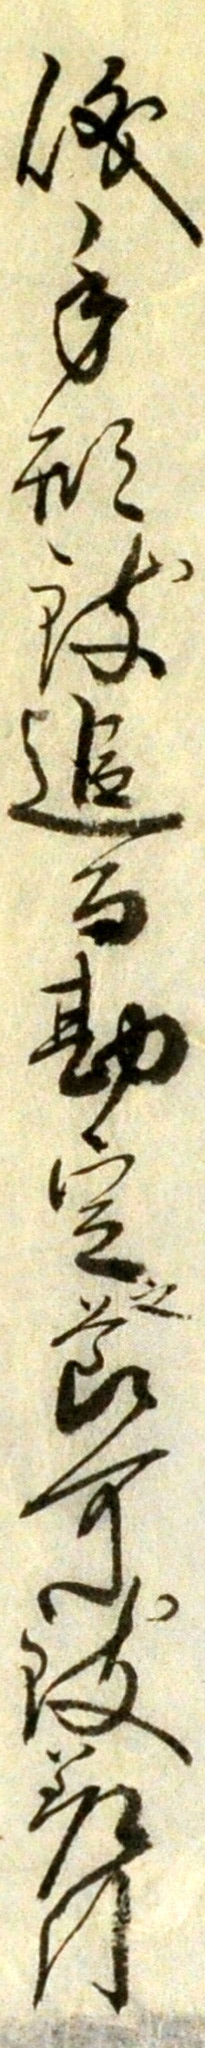儀手形致追而勘定之節可致差引
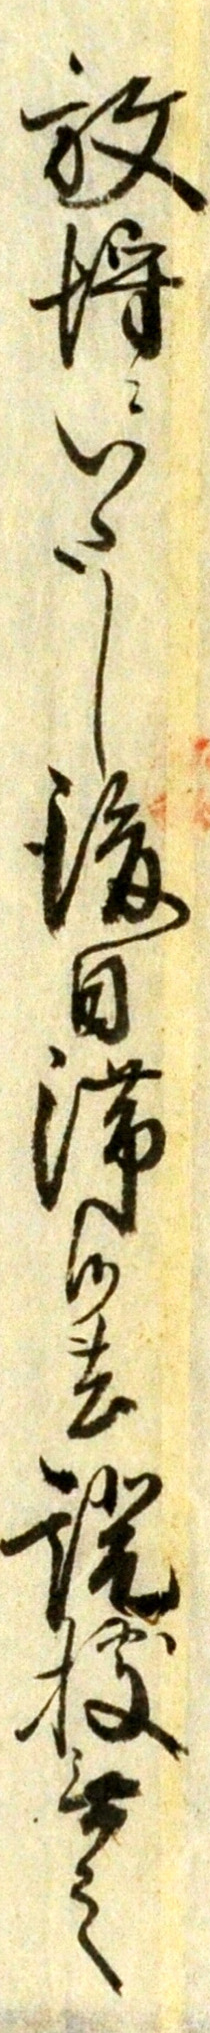放埓ニいたし後日滞候共証拠無之
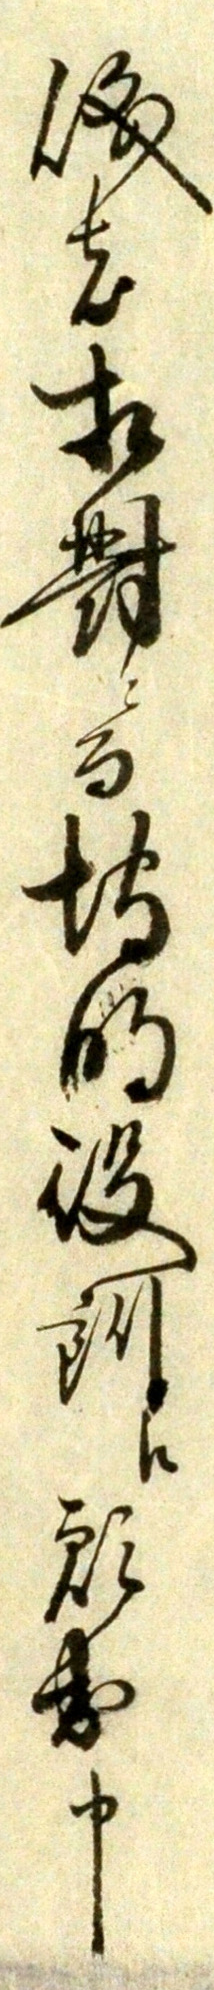儀者相対ニ而埒明役所江願出申
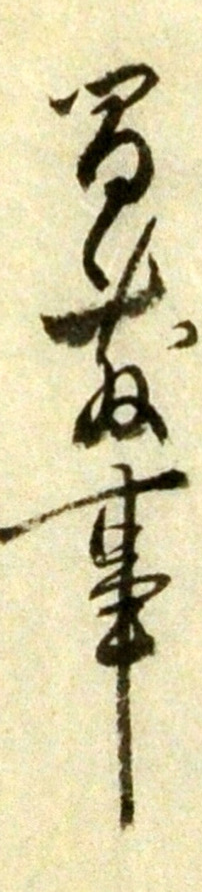間敷事
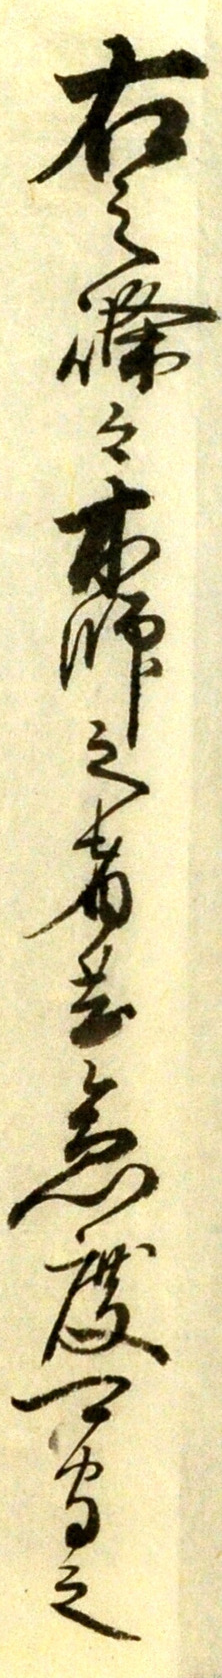右之條々木師之者共急度可守之
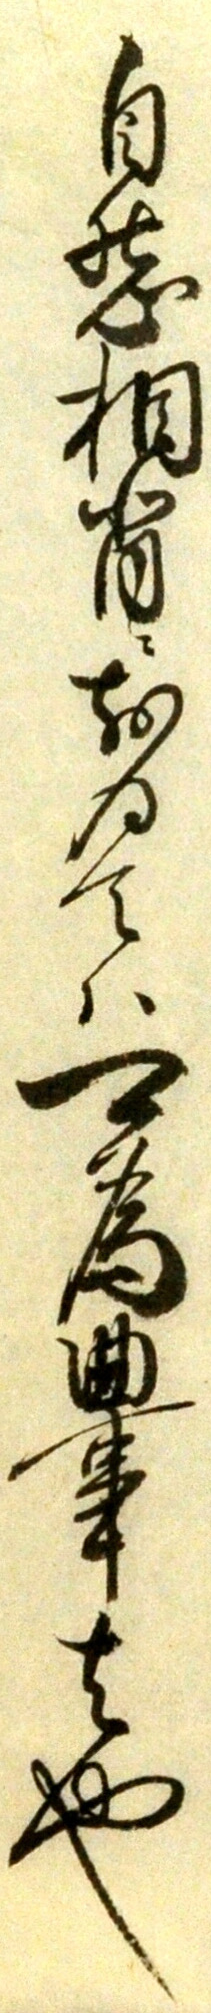自然相背ニおゐてハ可為曲事者也
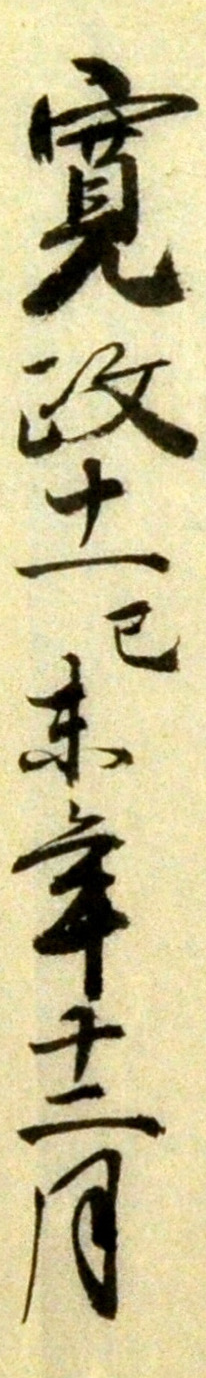寛政十一己未年十二月

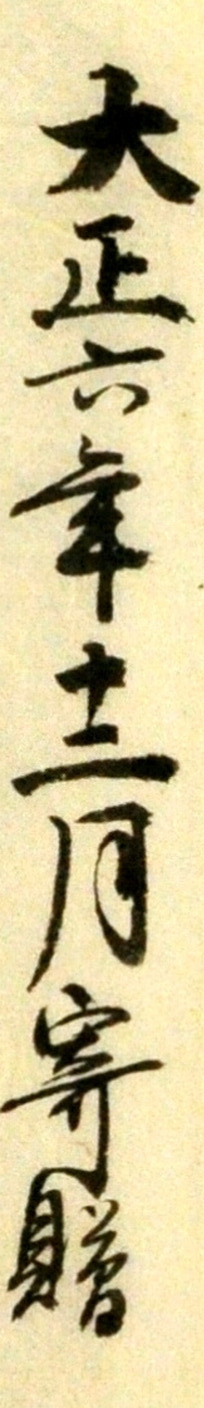大正六年十二月寄贈
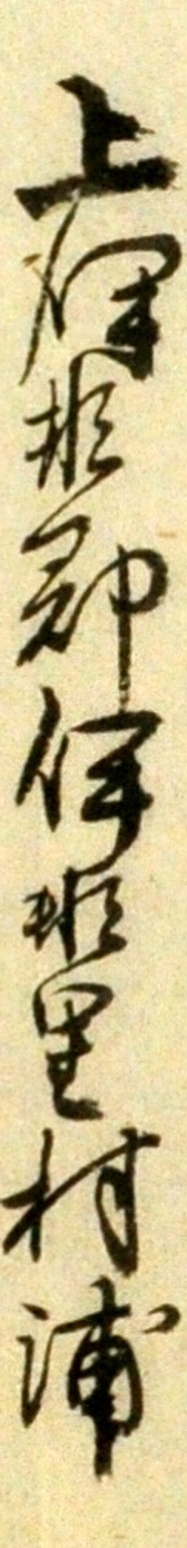上伊那郡伊那里村浦
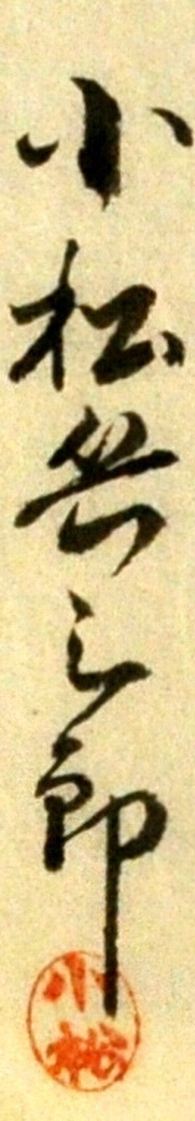小松兵三郎

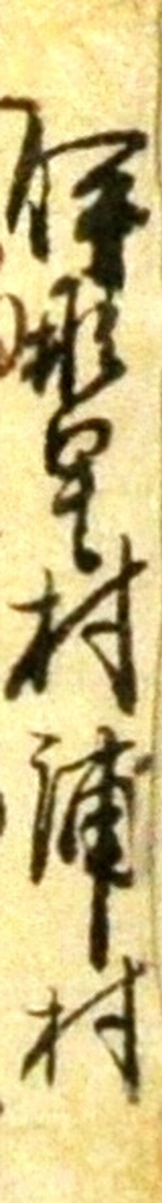伊那里村浦村
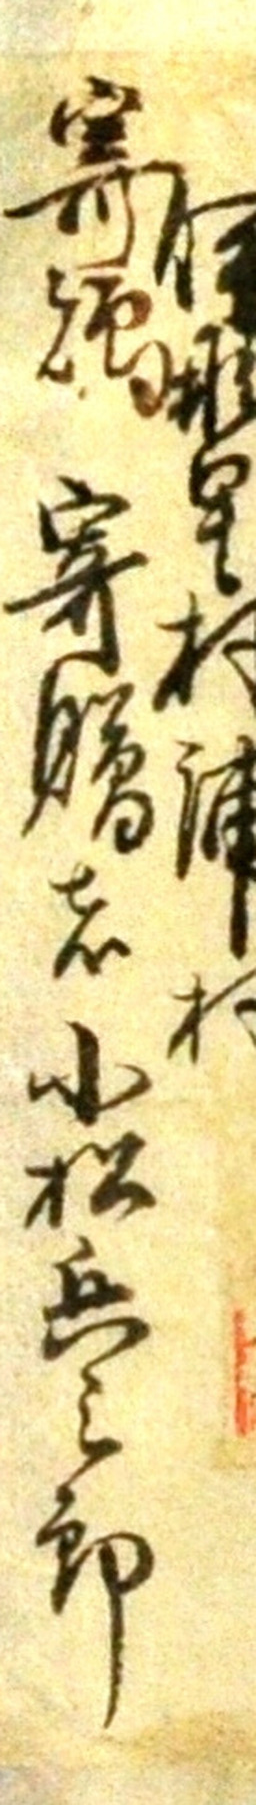寄贈寄贈者小松兵三郎
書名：木師定法（写）
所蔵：伊那市立高遠町図書館・合同会社AMANE
